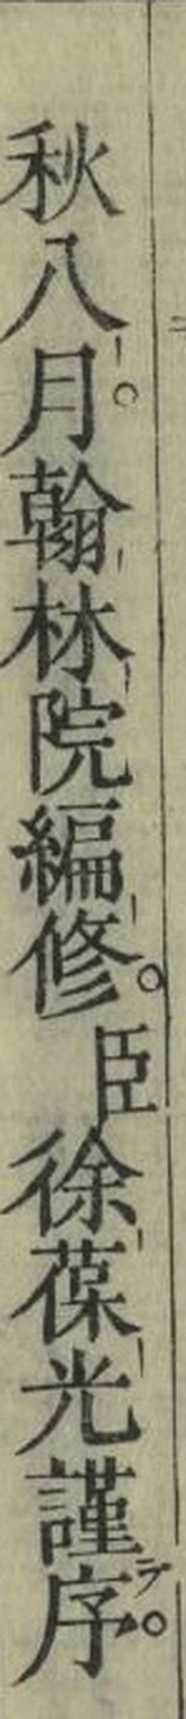秋八-月。翰-林-院編-修。臣徐-葆-光謹序。
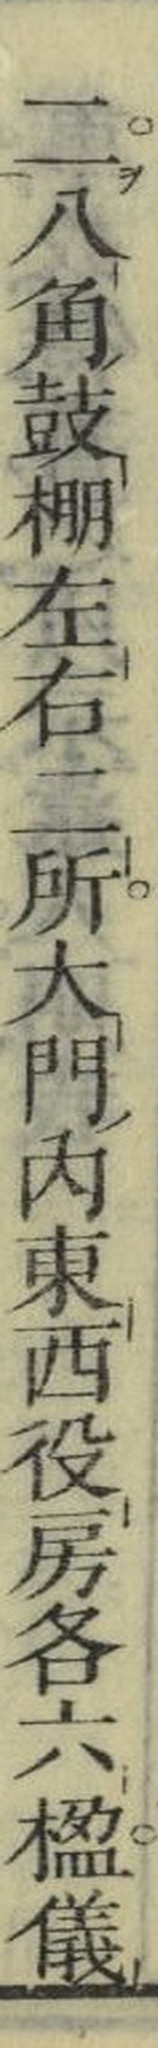二。八-角鼓-棚左-右二-所。大-門内東-西役-房各六-楹。儀-
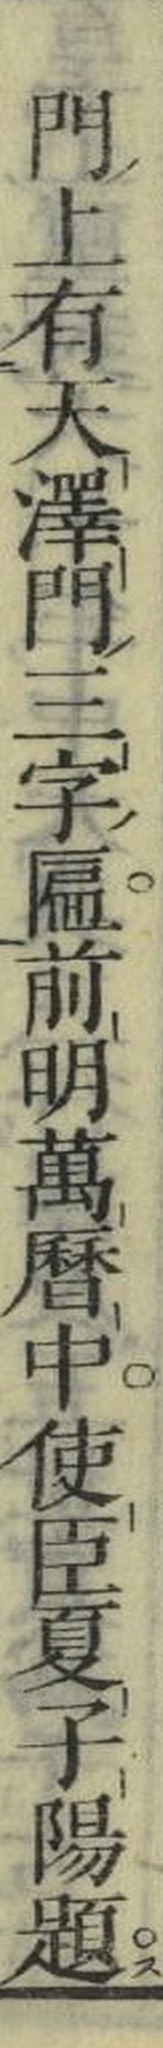門上有天-沢-門三-字匾。前-明万-暦-中。使-臣夏-子-陽題。

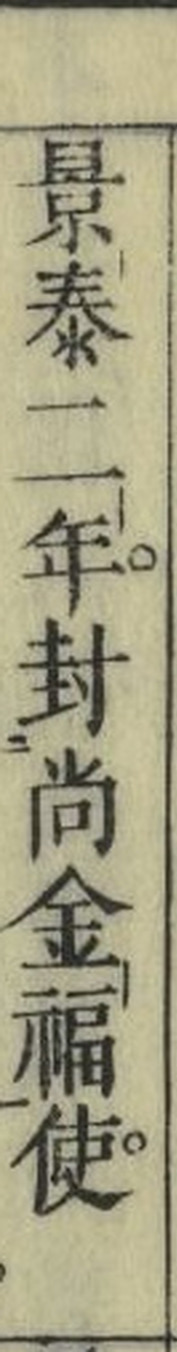景-泰二-年。封尚金-福使。
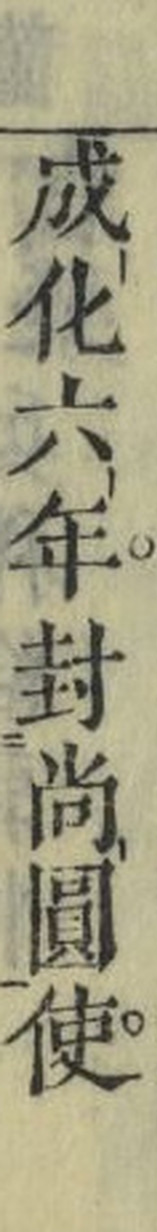成-化六-年。封尚-円使。

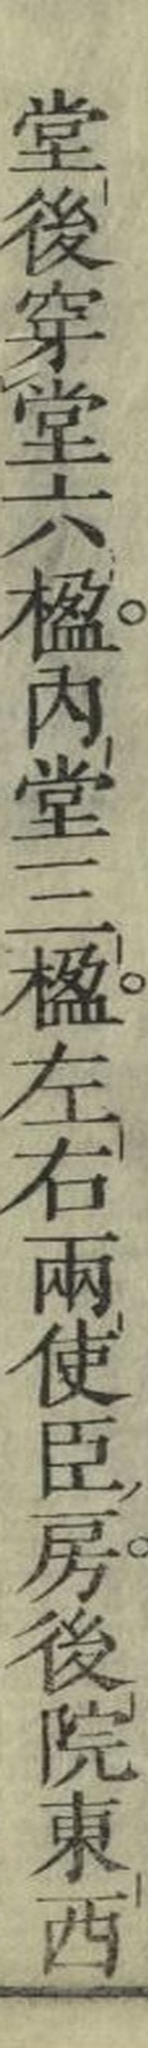堂-後穿堂六-楹。内-堂三-楹。左-右両-使臣房。後-院東-西
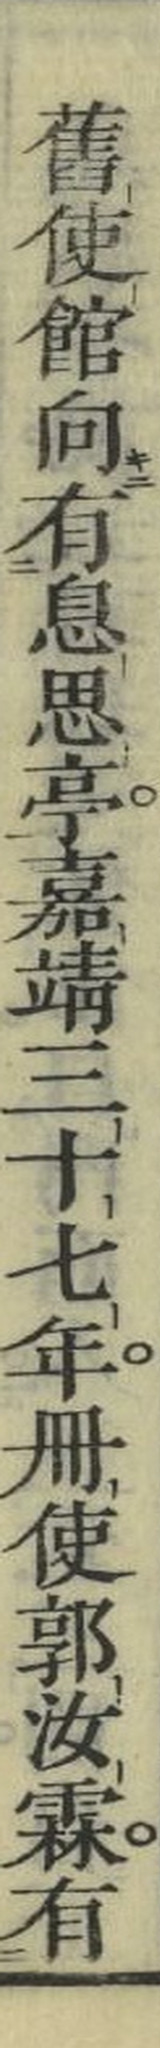旧-使-館向有息-思-亭。嘉-靖三-十-七-年。冊-使郭-汝-霖。有

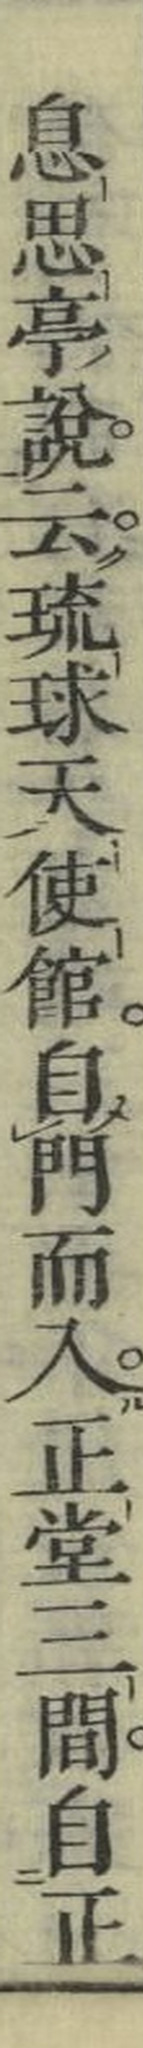息-思-亭説。云。琉-球天-使-館。自門而入。正-堂三-間。自正-

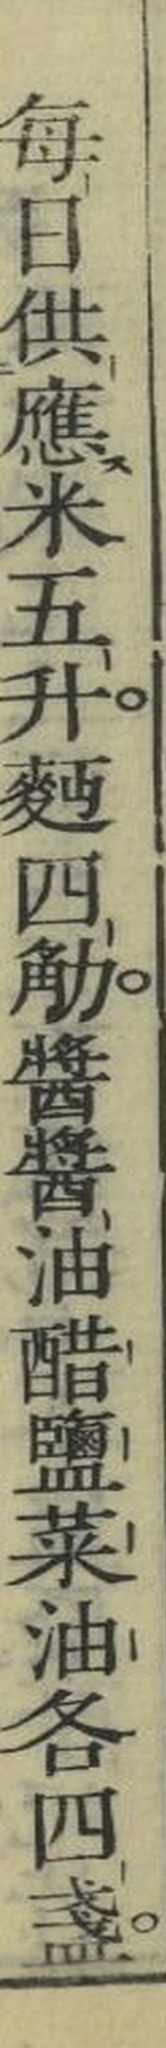毎-日供-応米五-升。麺四-觔。醬醬-油醋塩菜油各四-盞。
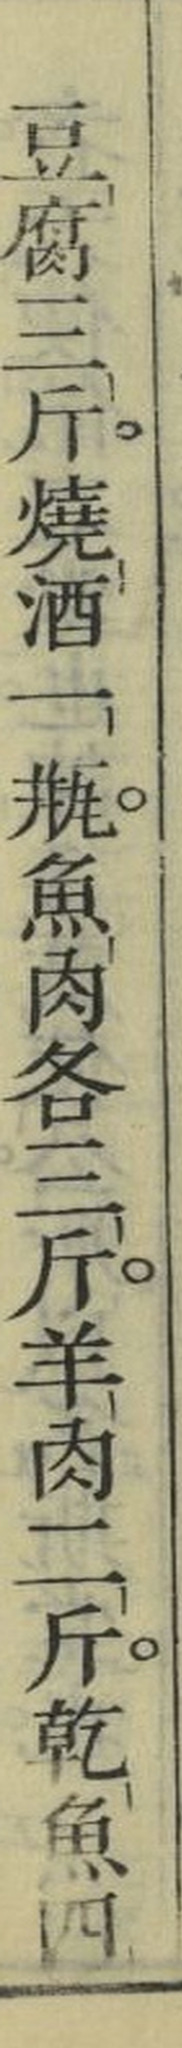豆-腐三-斤。焼-酒一-瓶。魚-肉各三-斤。羊-肉二-斤。乾-魚四-
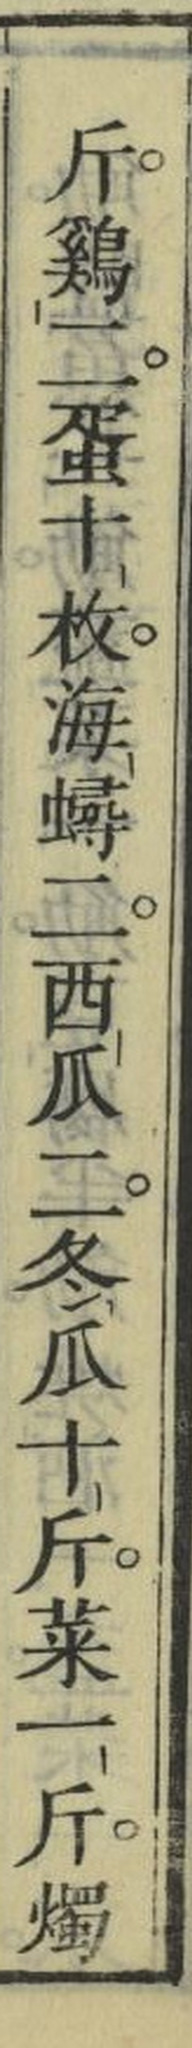斤。鶏-二。蛋十-枚。海-蟳二。西-瓜二。冬-瓜十-斤。菜一-斤。燭
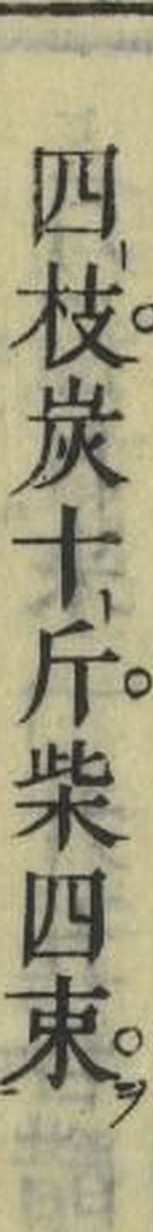四-枝。炭十-斤。柴四束。
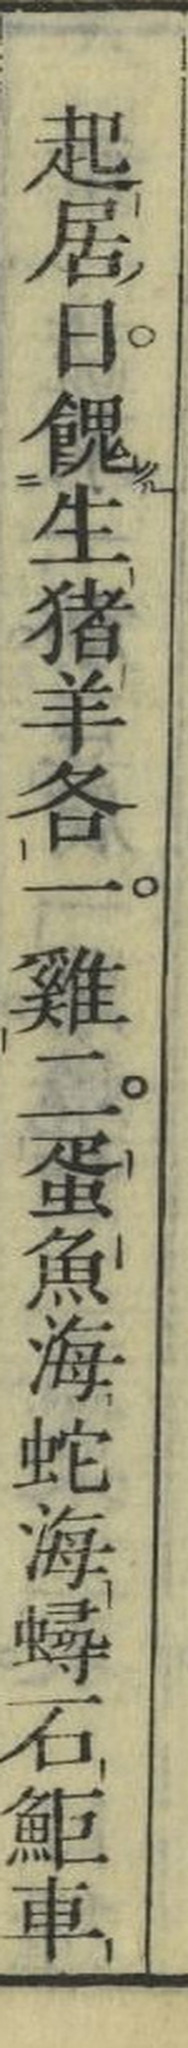起-居日。餽生-猪-羊各-一。鶏-二。蛋魚海-蛇海-蟳石-鮔車-
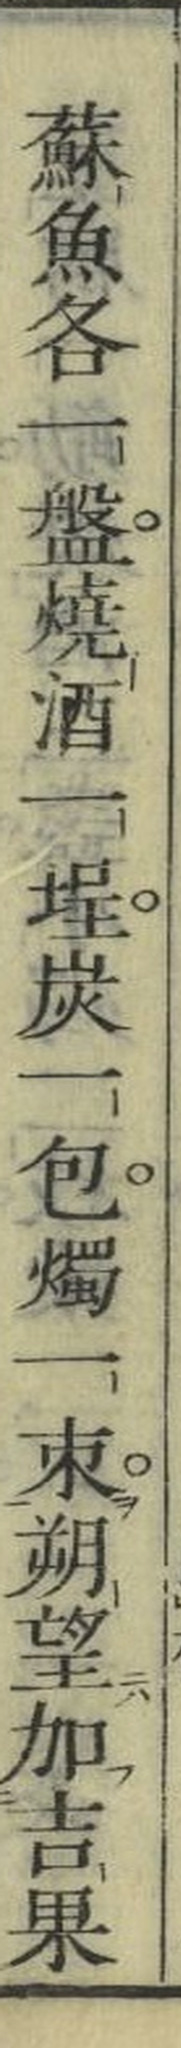蘇-魚各一-盤。焼-酒一-埕。炭一-包。燭一-束。朔-望加吉-果
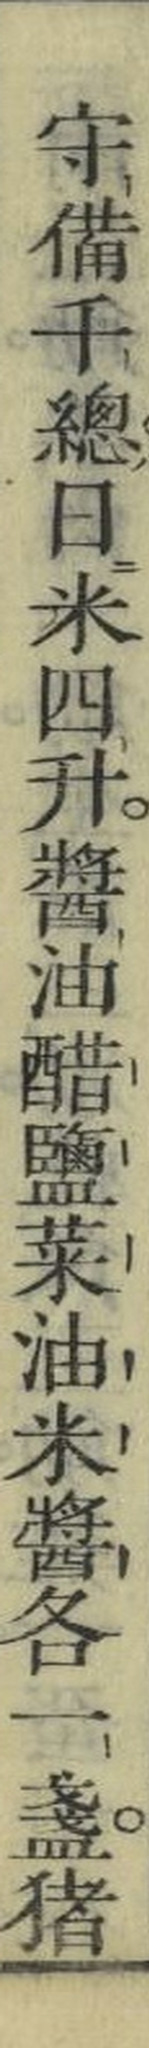守-備千-総。日米四-升。醬-油醋塩菜油米醬各一-盞。猪

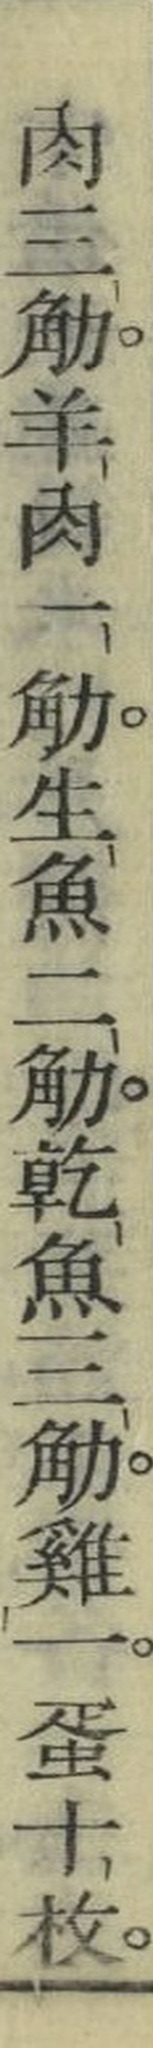肉三-觔。羊-肉一-觔。生-魚二-觔。乾-魚三-觔。鶏-一。蛋十-枚。
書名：中山伝信録 巻二
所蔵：University of the Ryukyus Library
